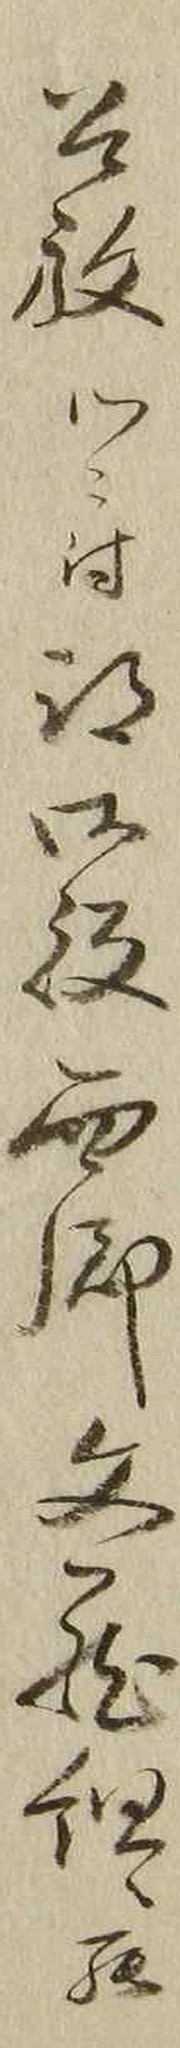召放候ニ付跡御役西郷文蔵組へ罷
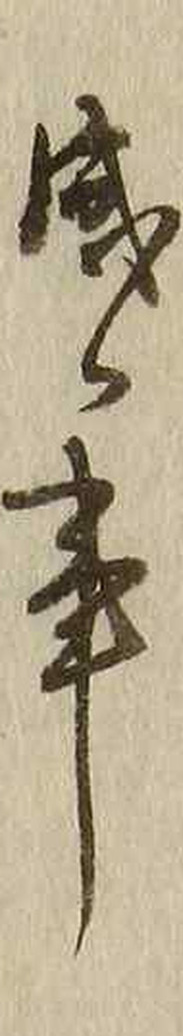成候事
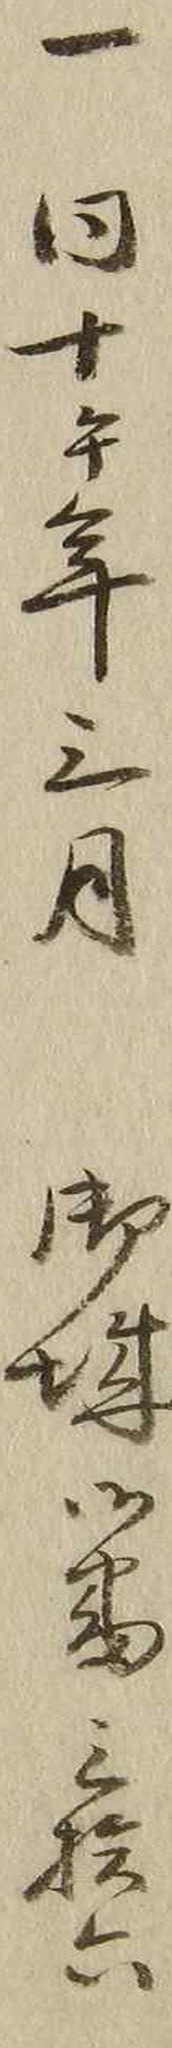一同十午年三月御城御番三拾六
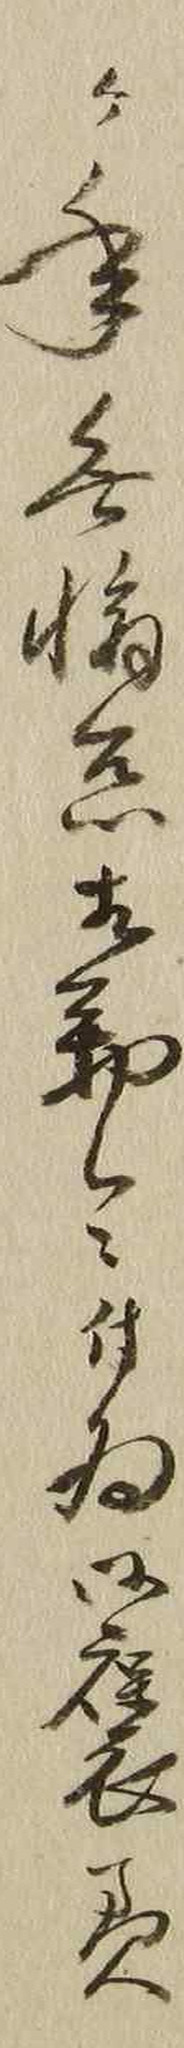ヶ年無懈怠相勤候ニ付為御褒美
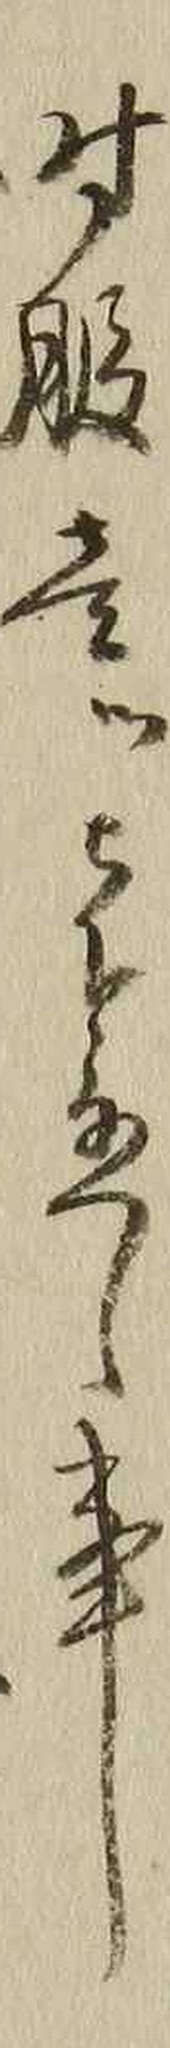時服壱ツ被下置候事
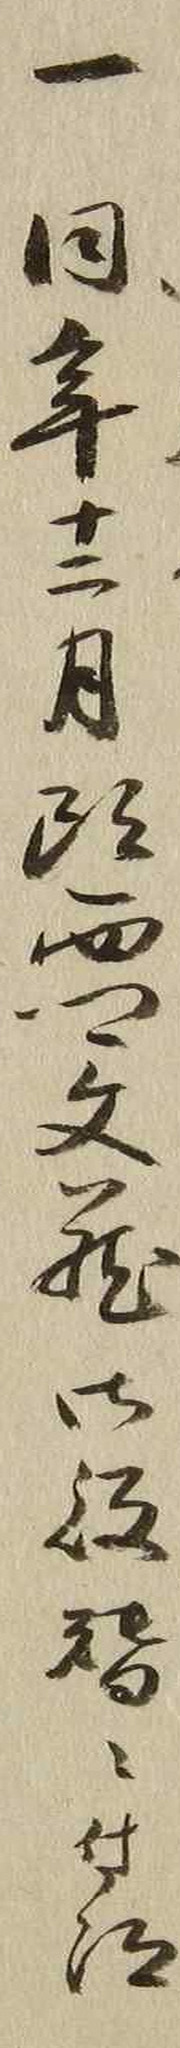一同年十二月頭西郷文蔵御役替ニ付跡
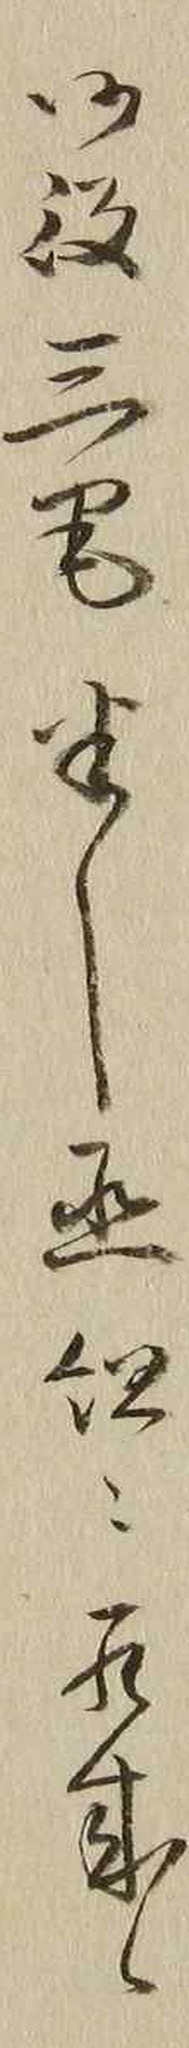御役三宅半之丞組ニ罷成候
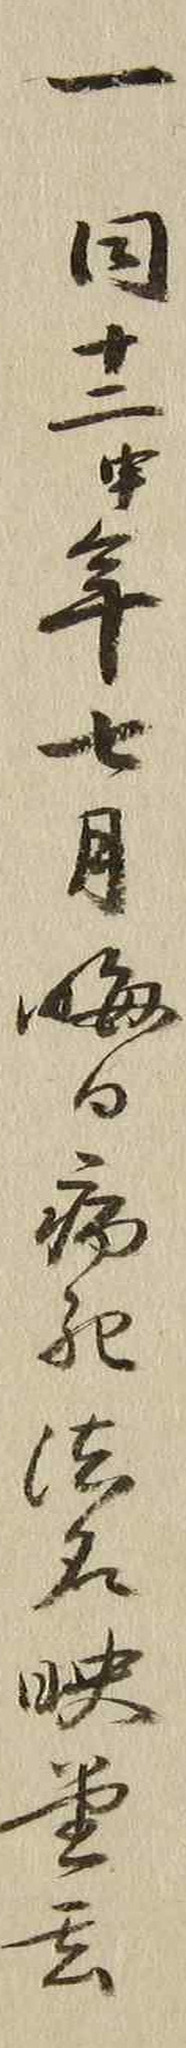一同十二申年七月晦日病死法名映堂玄
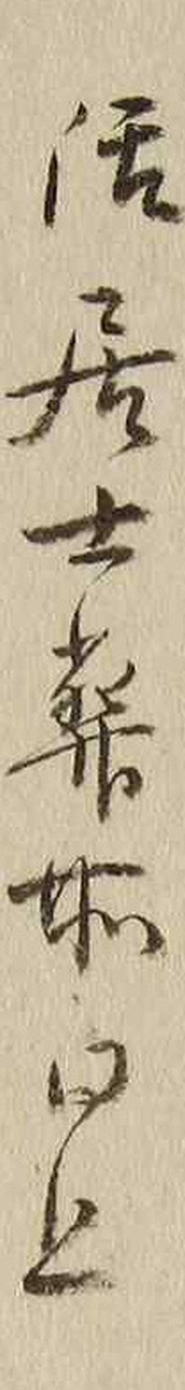活居士葬所同上
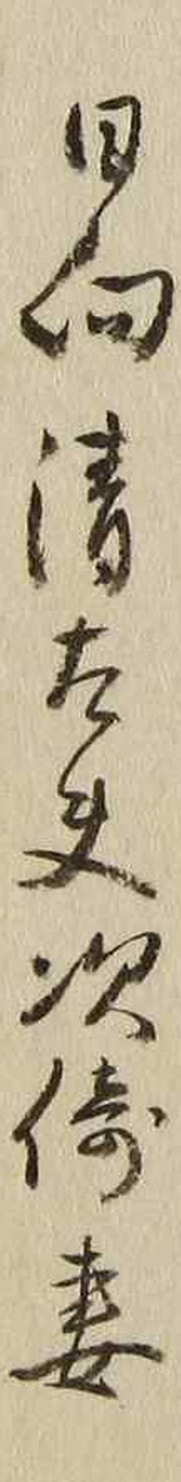女日向清太夫次倚妻
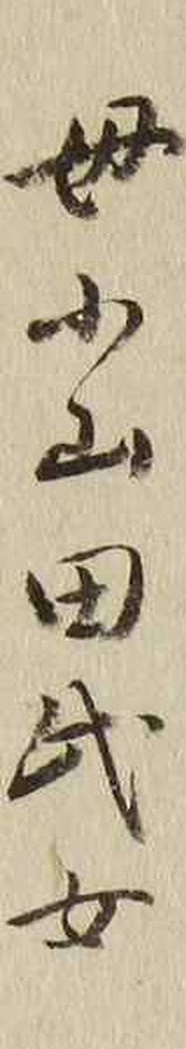母小山田氏女

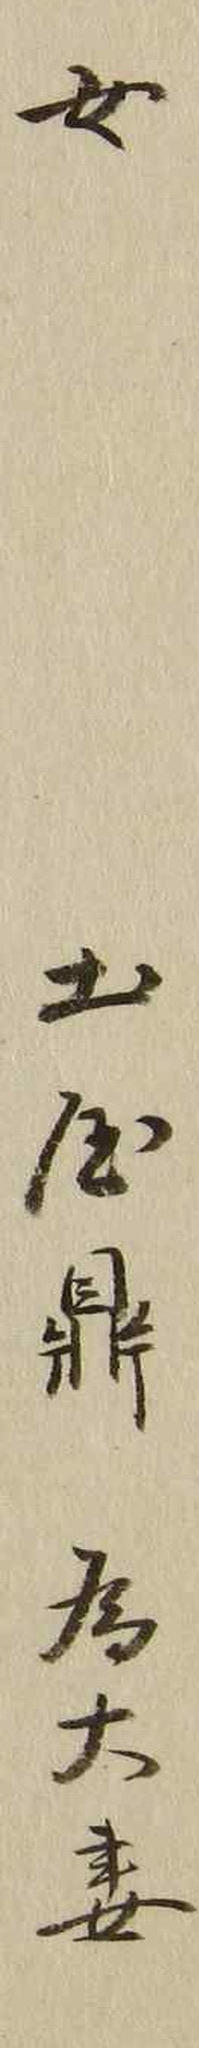女土屋鼎為大妻
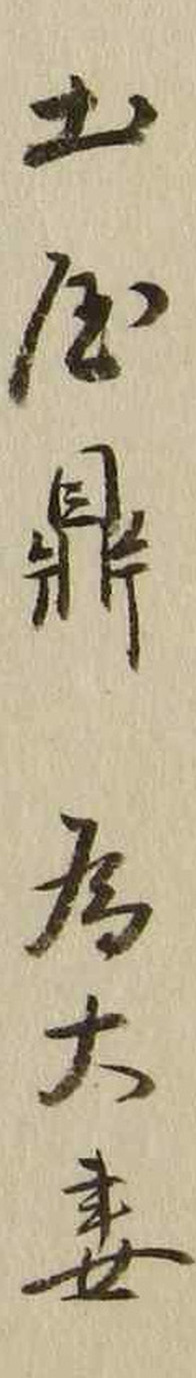女土屋鼎為大妻
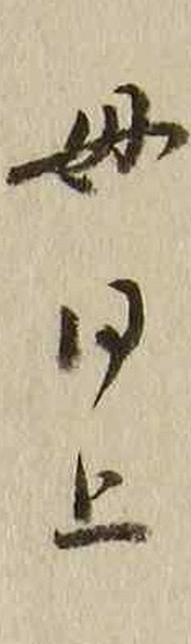母同上
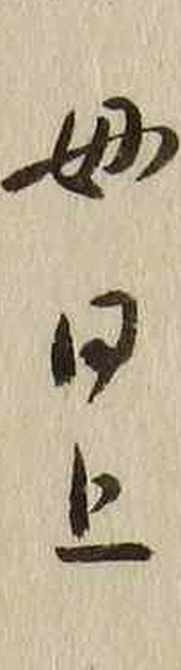母同上
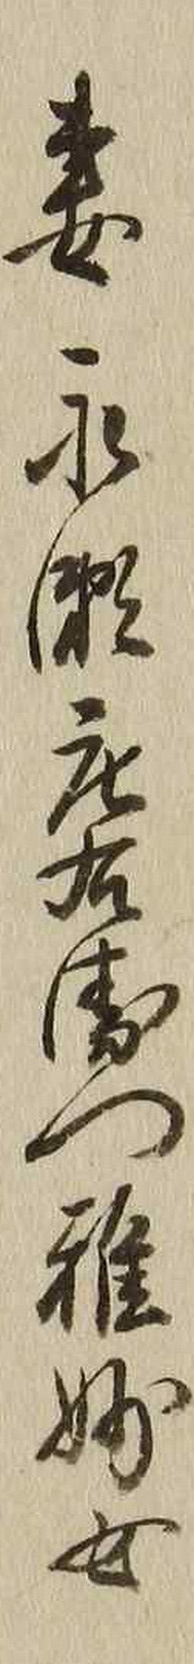妻永瀬庄右衛門雅妙女
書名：諸士系譜　巻之236　ふ之部4
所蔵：会津若松市立会津図書館
